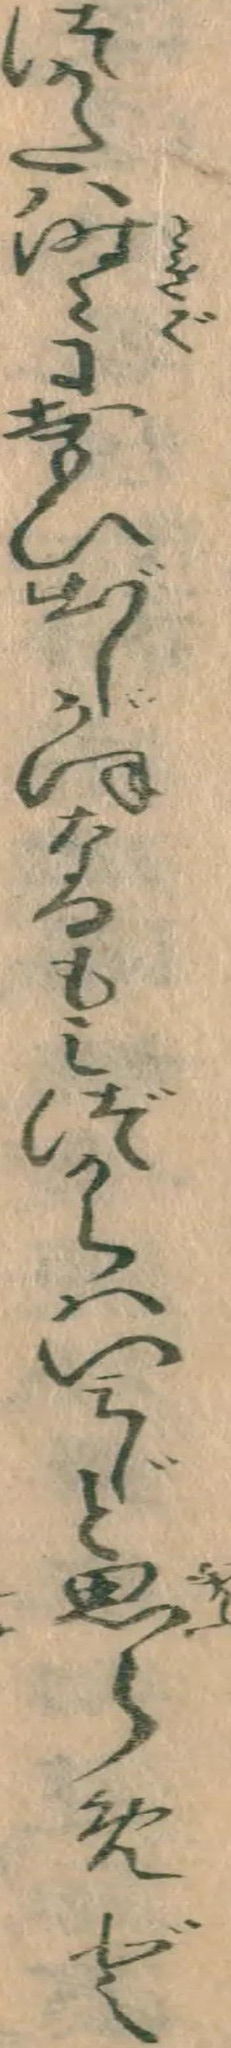つかたは時々におもひ”出しがほなるもみづからはいみじと思らめど
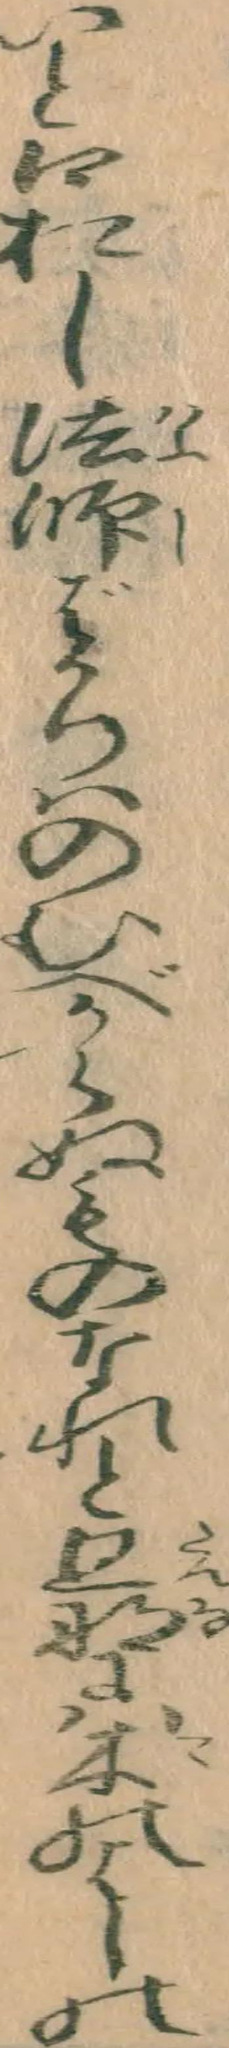いと口おし法師ばかりはのむべからぬものなれと旦那には木のはしの
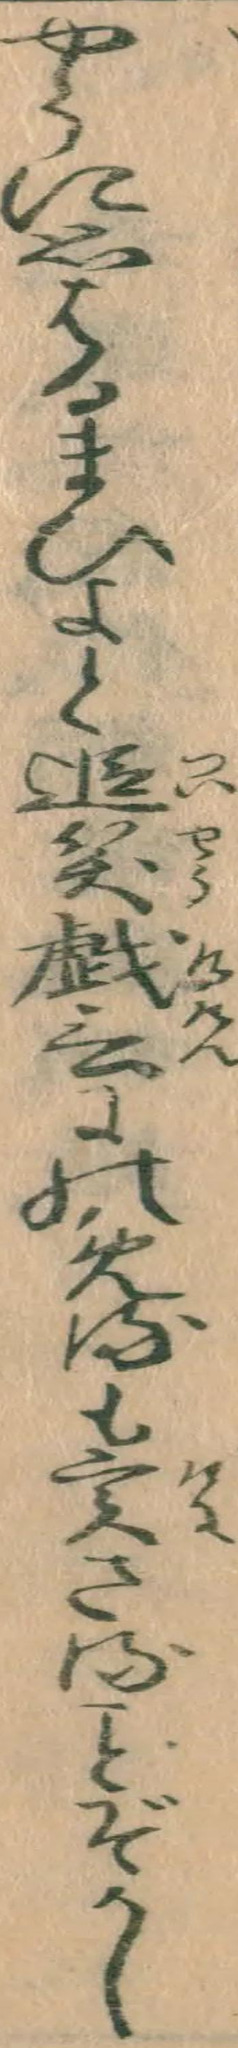やうに思はるまいよと追笑戯言にのめるも実さることぞかし
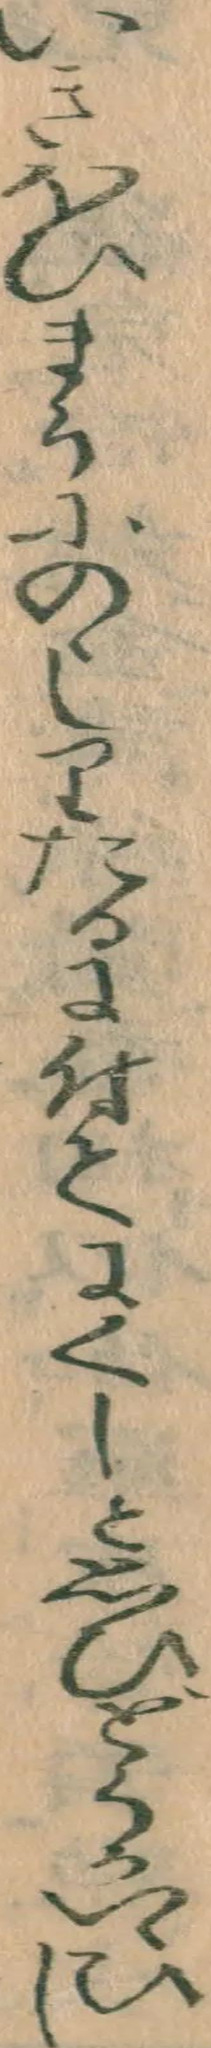いきほひまうにのゝしりたるに付てにくしと思ひどうかいゝひし
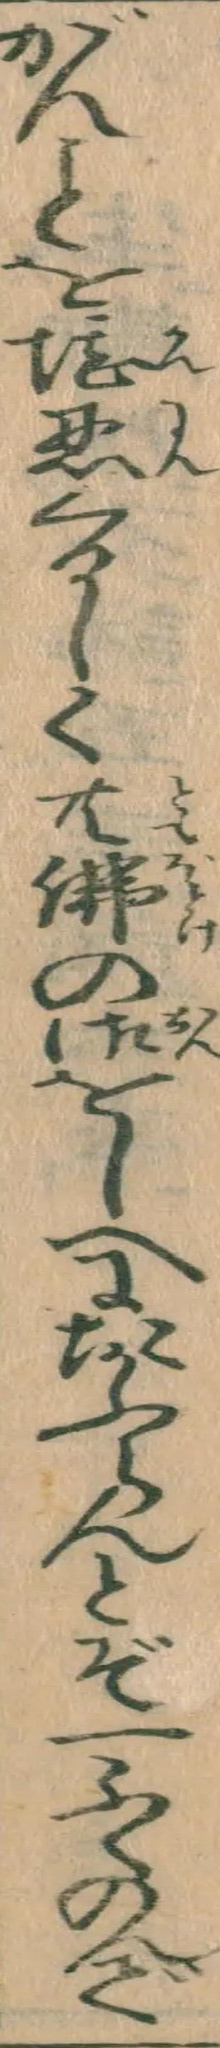がんことを堪忍くるしく共仏の御をしへにたかふらんとぞ一ふくのんで
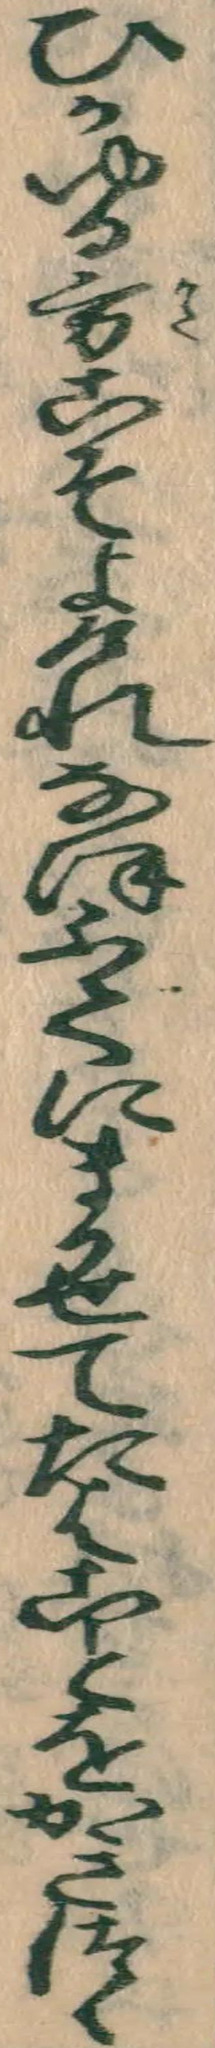ひかゆる方こそよけれなほふでにまかせてたはことかきつゝ
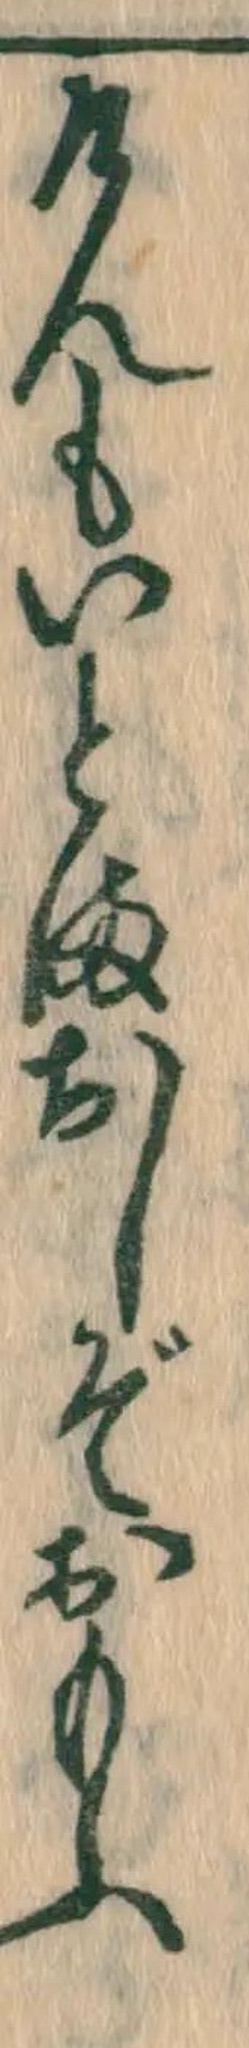けんもいとまおしぞおもふ
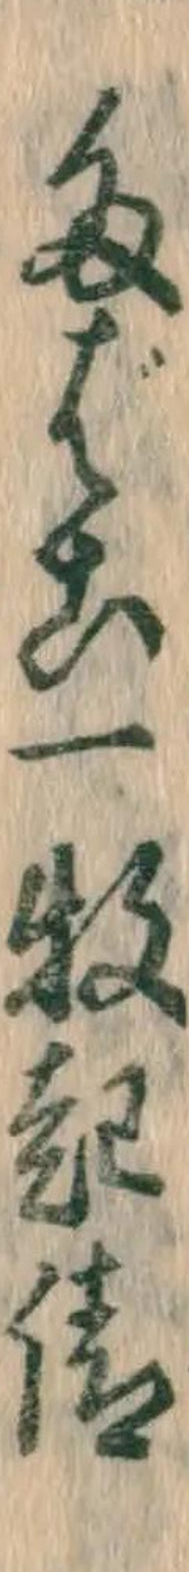たばこ一枚起請
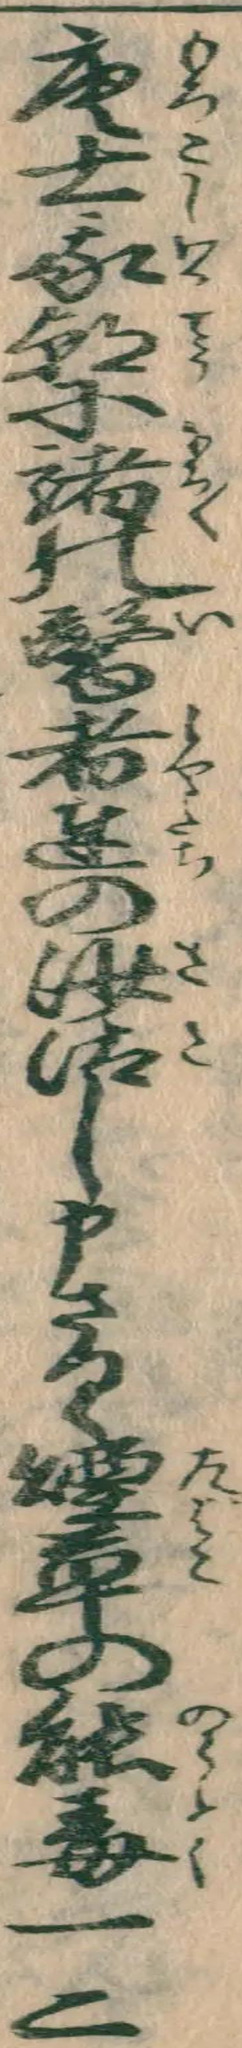唐土我朝に諸の医者達の沙汰し申さるゝ煙草の能毒一二
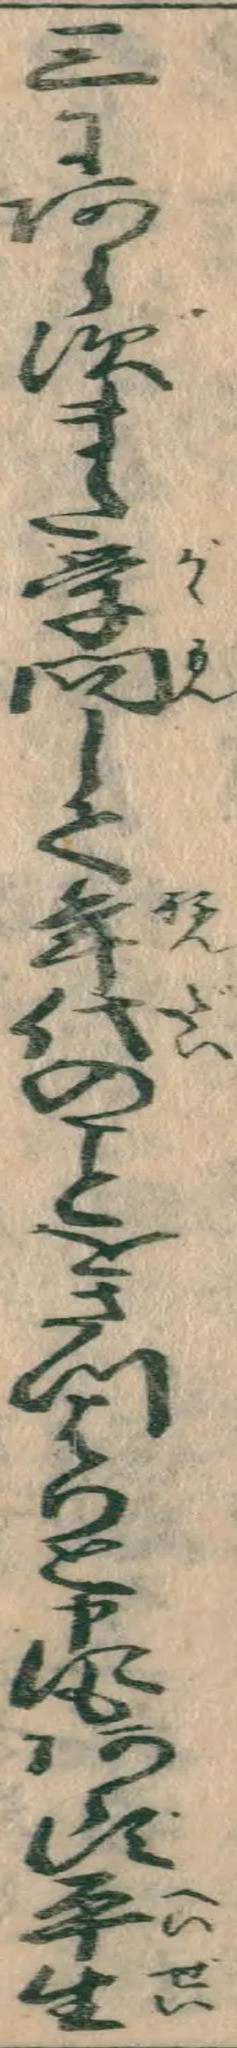三にあらずまた学問して年代のことをさつはりと申にもあらす平生
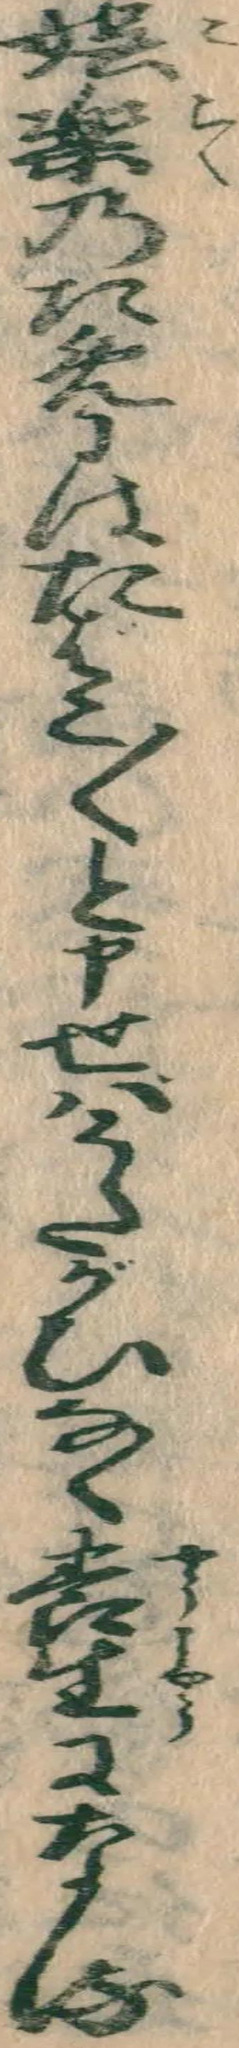娯楽のためにはたばこと申せばうたがひなく養生になる
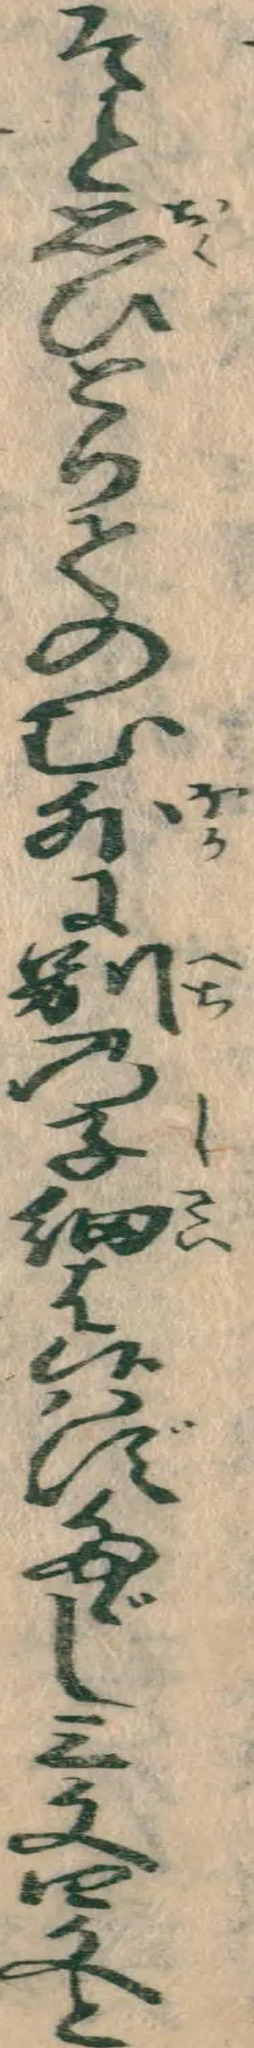そと思ひとりてのむ外に別の子細は候はずたゞし三文四文と
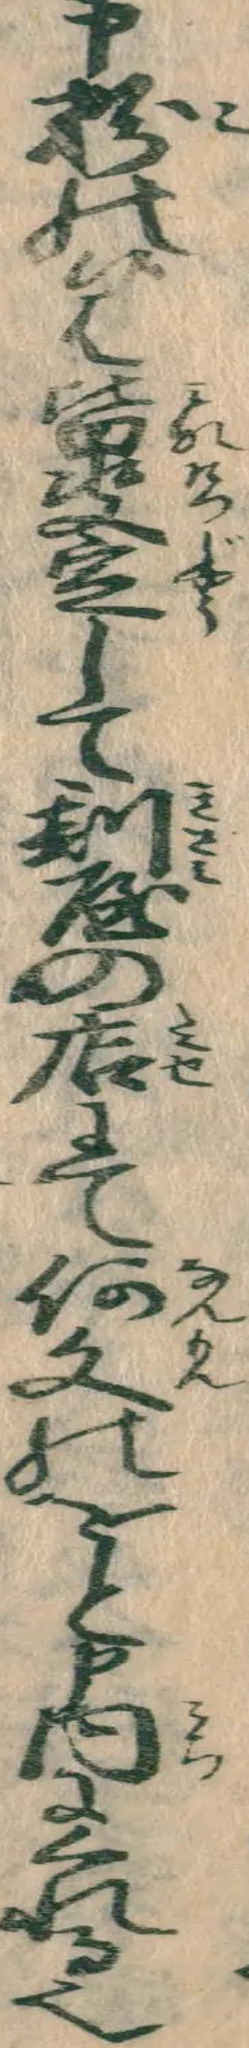申粉の候は皆決定して刻屋の店にて何文のをと申内にくれる也
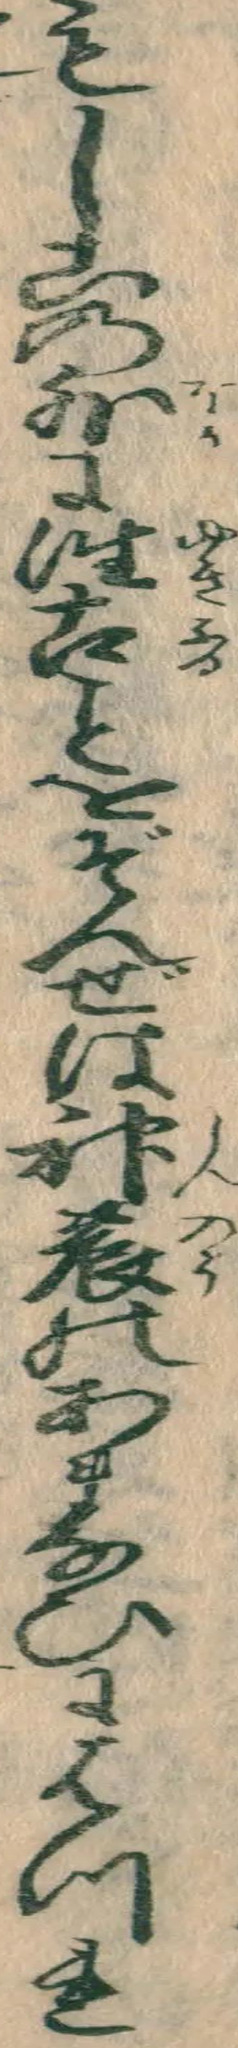もしこの外に往古ことをぞんぜは神農のあまなひにはつれ
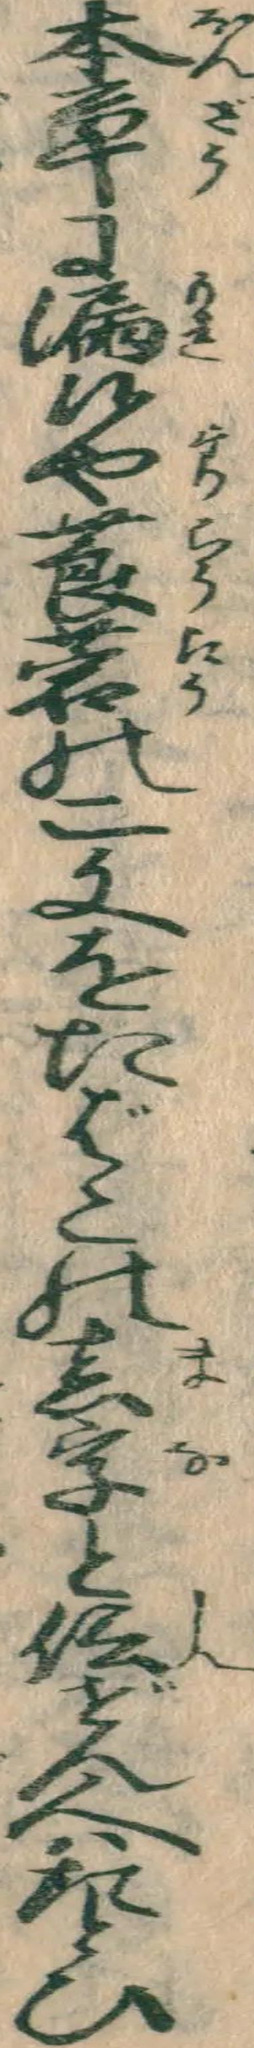本草に漏候也莨菪の二文をたばこの真字と信ぜん人はたとひ
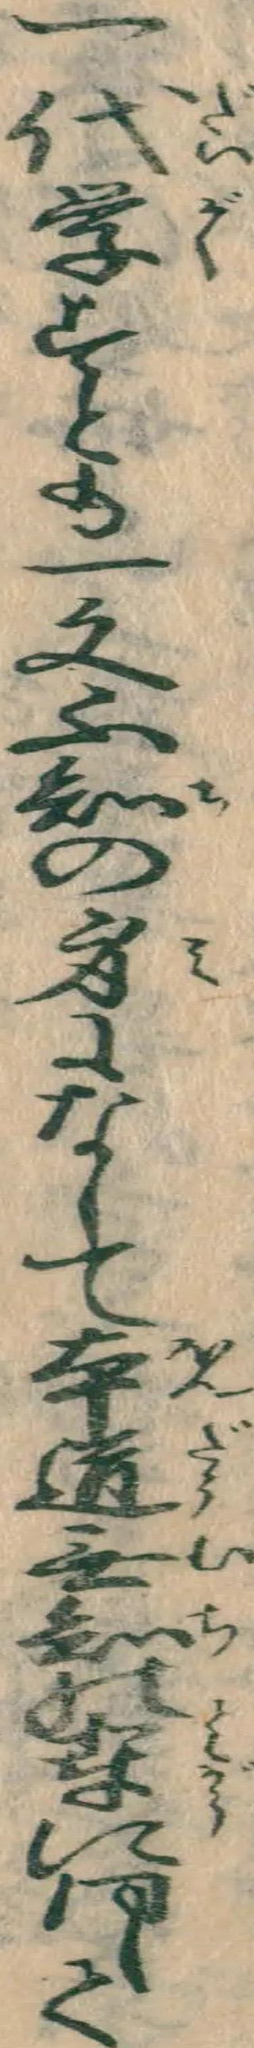一代学すとも一文不知の身になして本道無知の輩に同して
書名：煙草記
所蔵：国立国会図書館 National Diet Library, JAPAN
